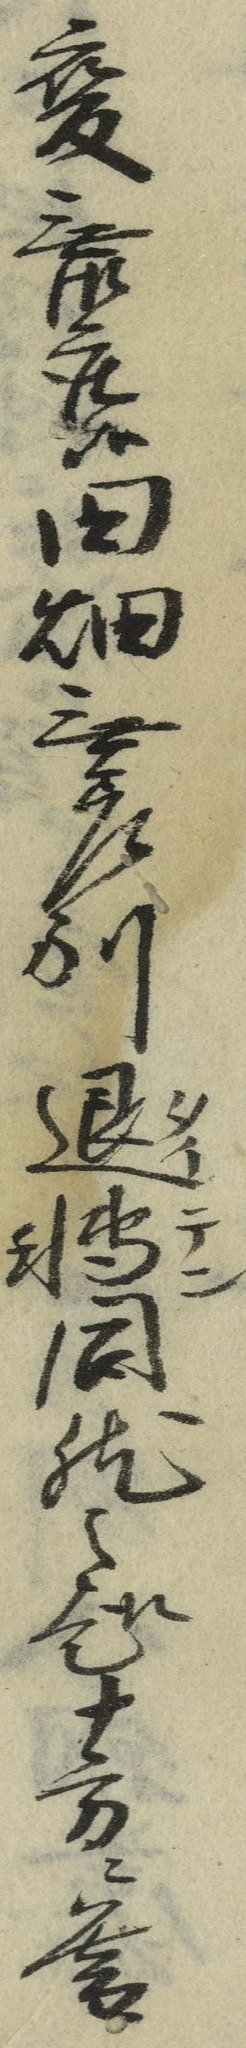変無御座候田畑無差別退転同然之趣十方に暮
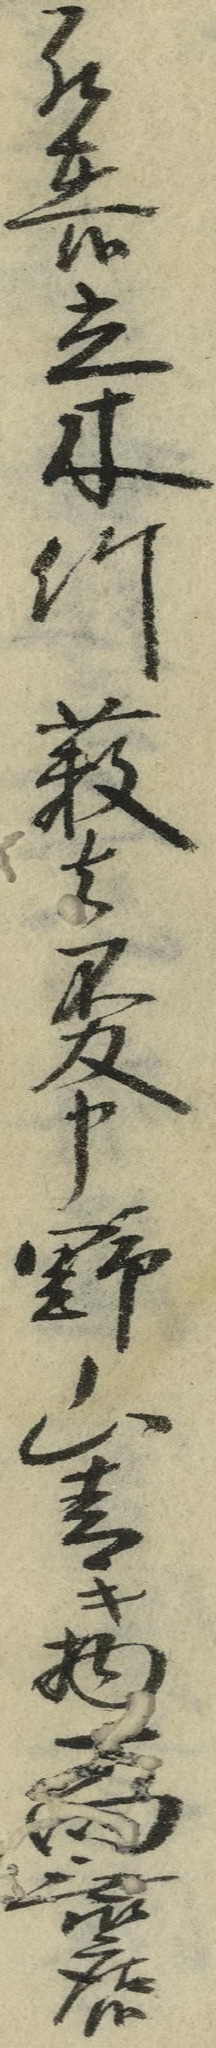罷在候立木竹藪は不及申野山青キ物一向無御座候
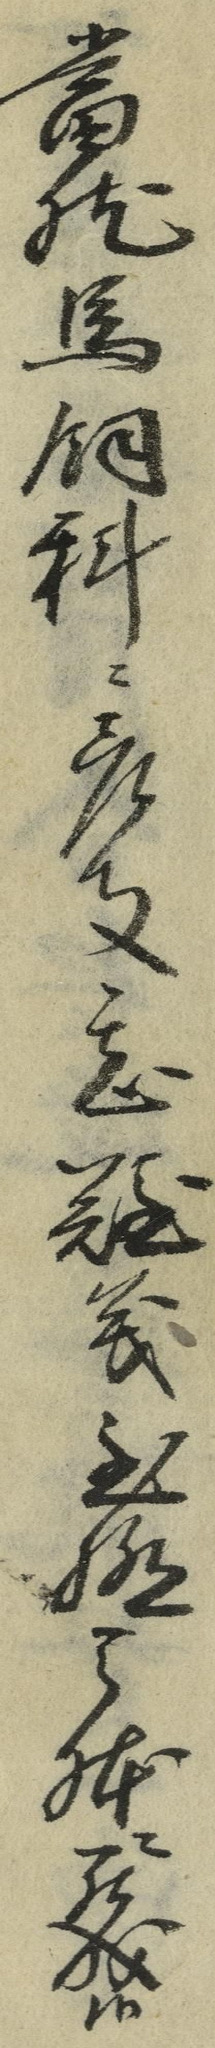当然馬飼料に差支甚難義至極之体に罷成候
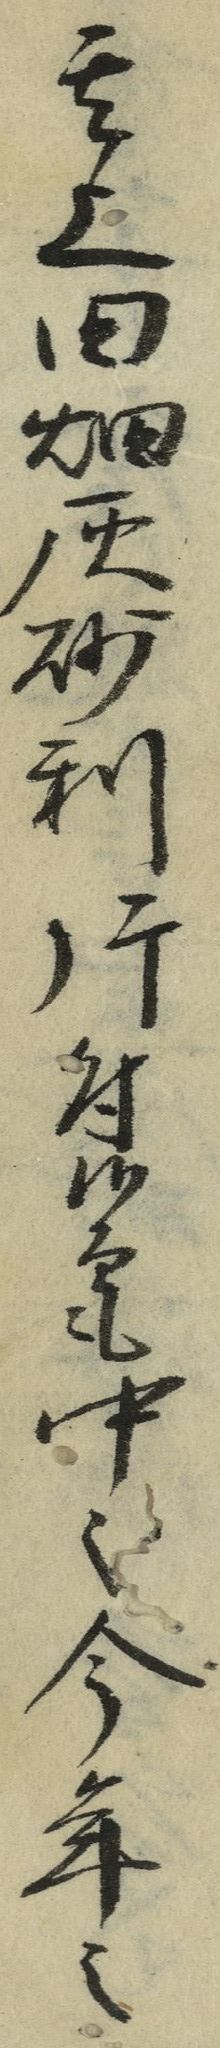其上田畑灰砂利片付候而も中々今年之
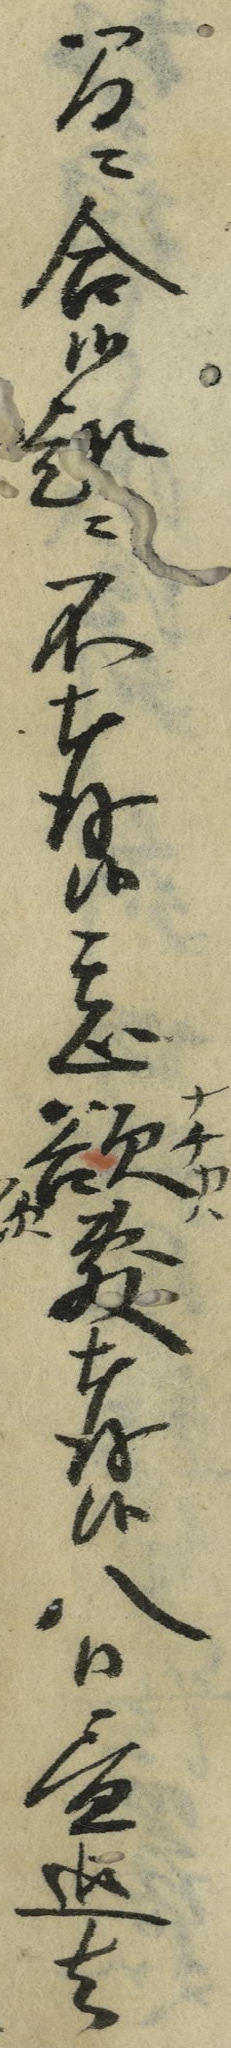間に合候趣に不奉存候甚欲敷奉存候八日昼迄は
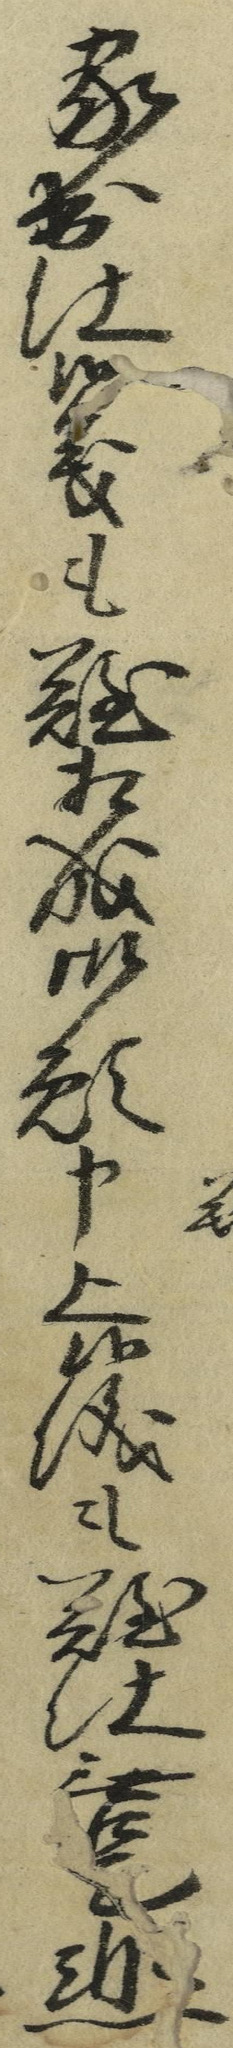家出仕候義も難相成御願申上候儀も難仕無是悲
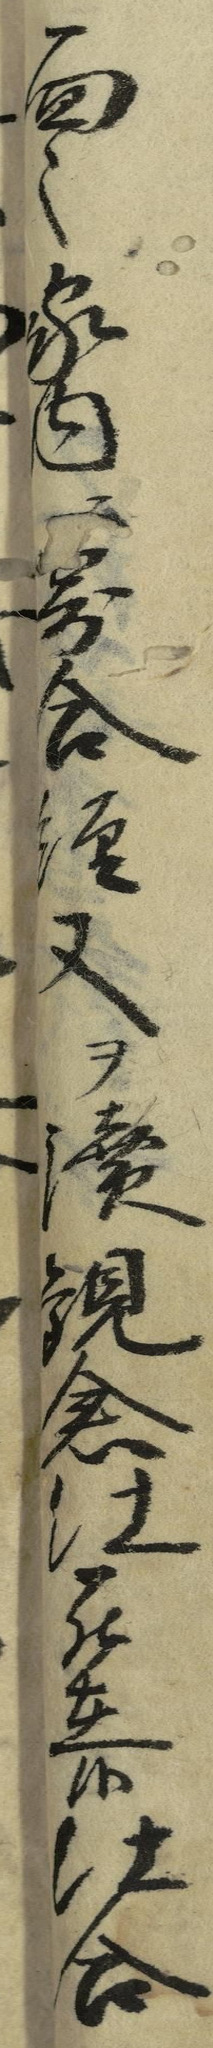面々家内に寄合経文ヲ読観念仕罷在候仕合
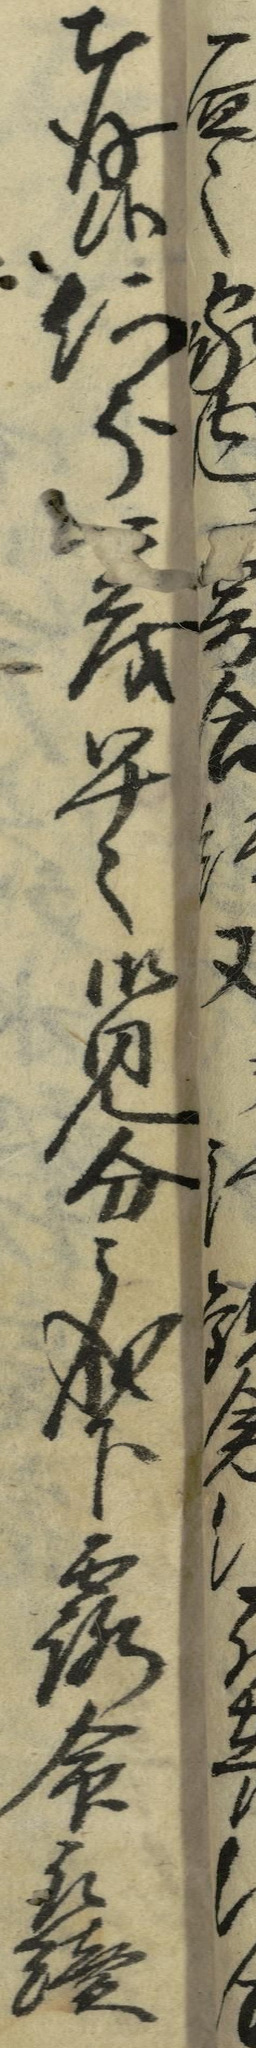奉存候何分にも早々御見分被成下露命取続
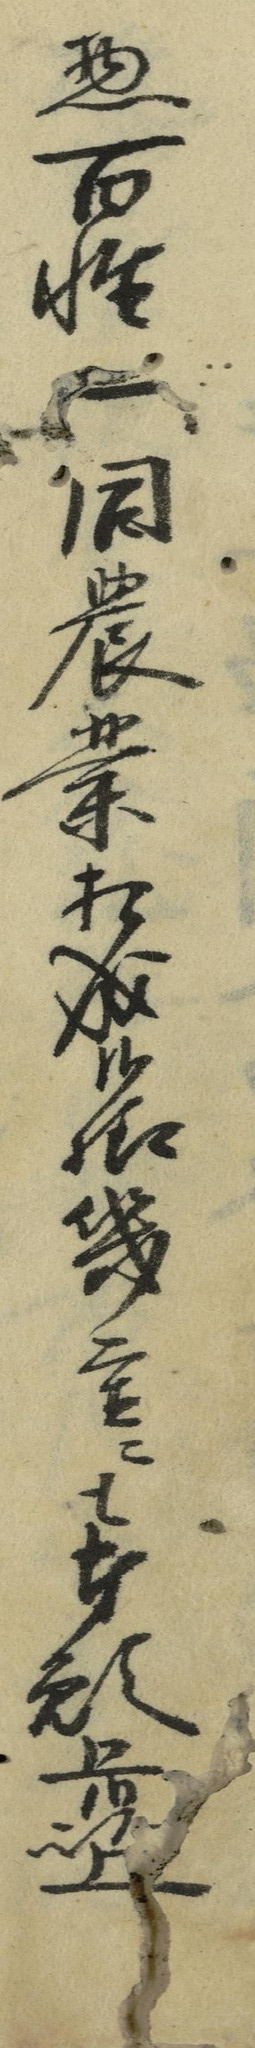惣百姓一同農業相成候様幾重にも奉願上候以上
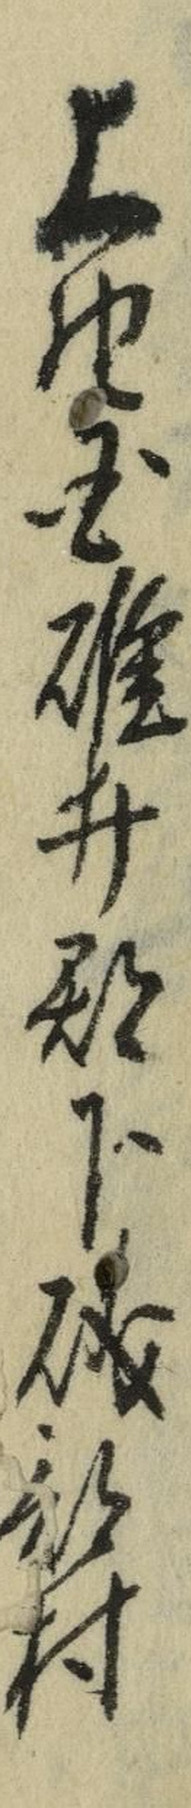上野国碓井郡下磯部村
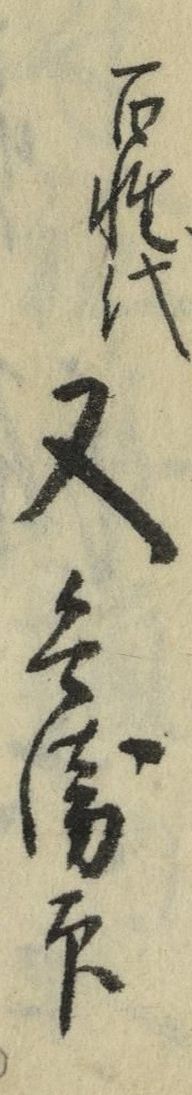百姓代又兵衛印
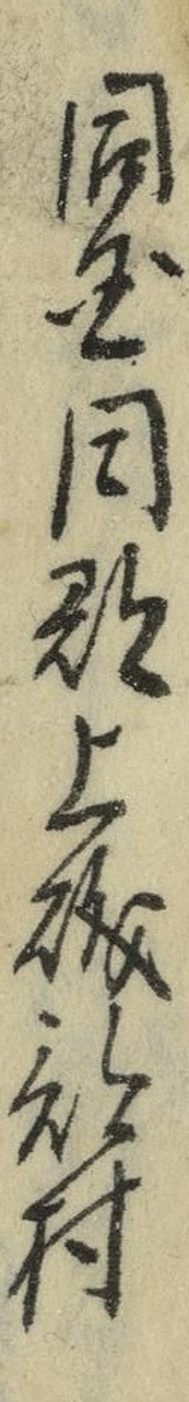同国同郡上磯部村
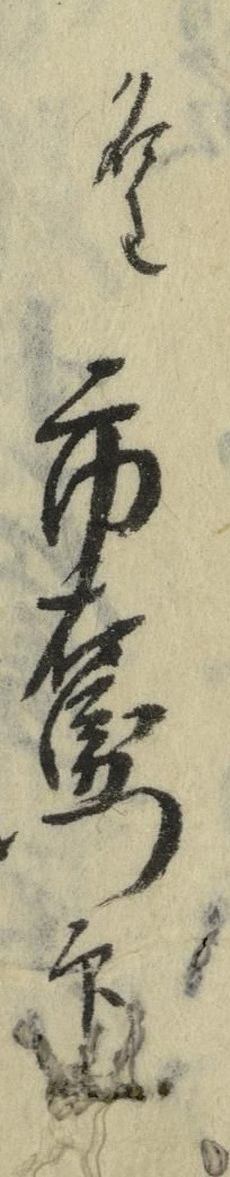名主市右衛門印
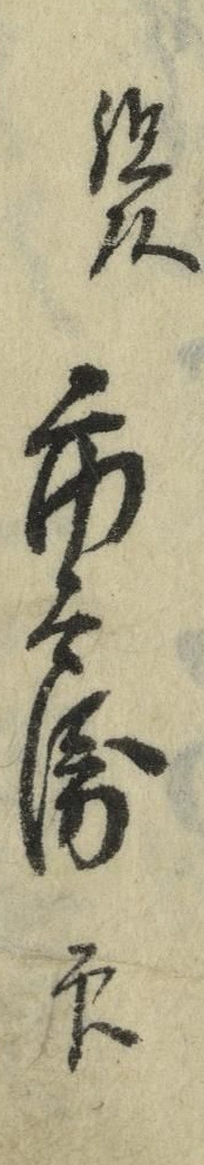組頭市兵衛印

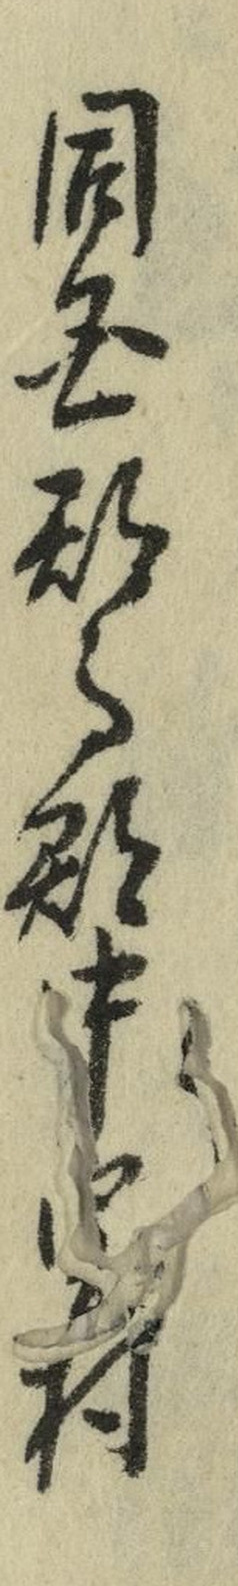同国郡馬郡中里村
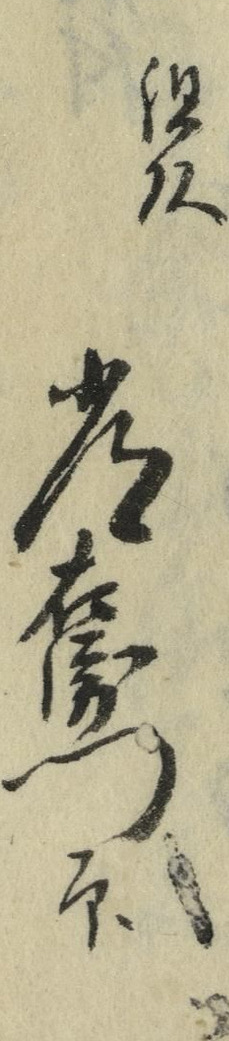組頭彦右衛門印
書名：天明三卯年七月　浅間山焼注進写
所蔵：東京大学地震研究所図書室 Earthquake Research Institute Library, The University of Tokyo, JAPAN
